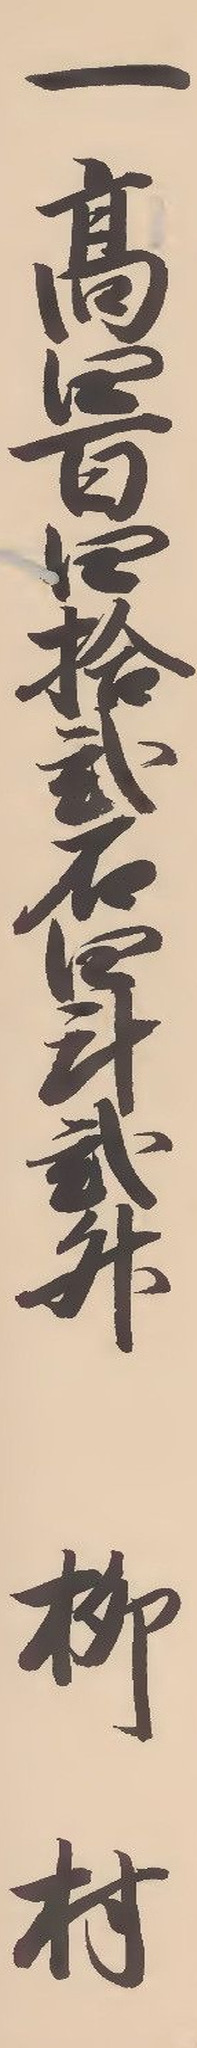一高四百四拾弐石四斗弐升柳村
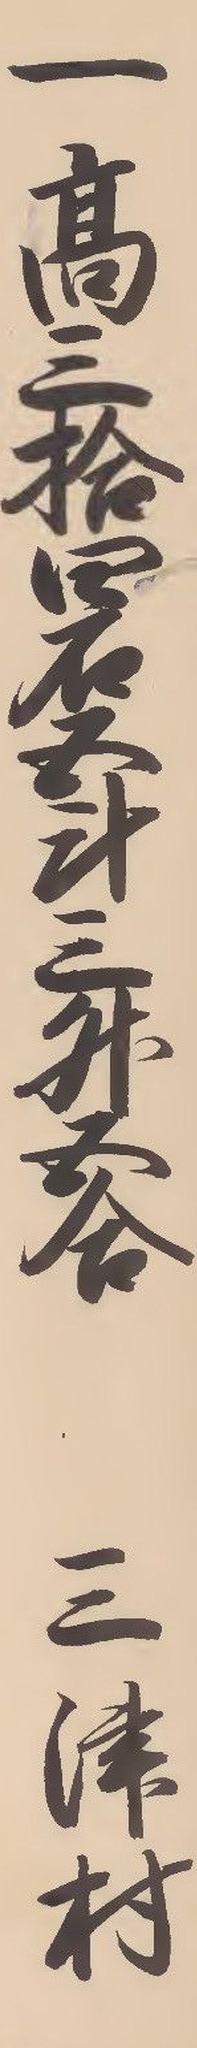一高三拾四石五斗三升五合三津村
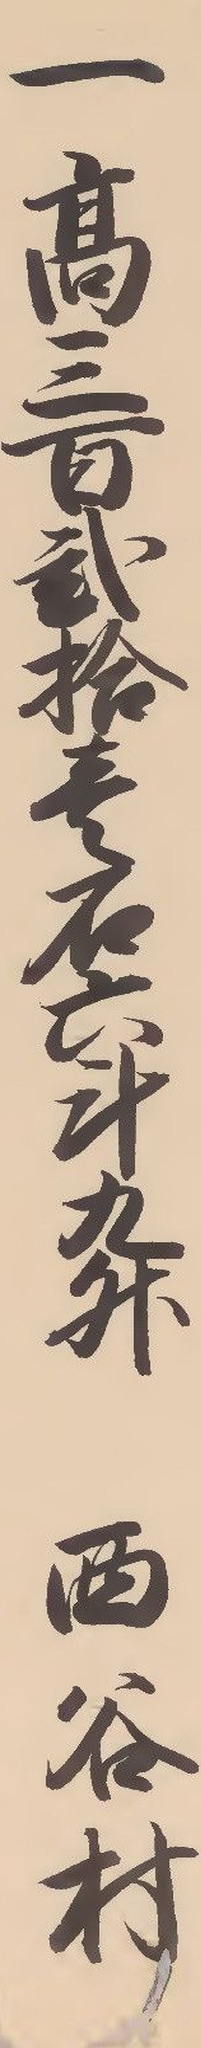一高三百弐拾壱石六斗九升西谷村
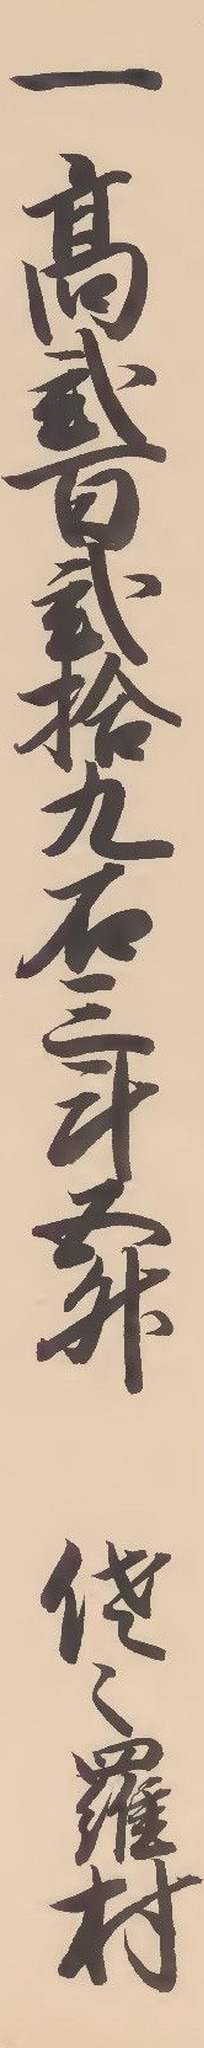一高弐百弐拾九石三斗五升佐々羅村
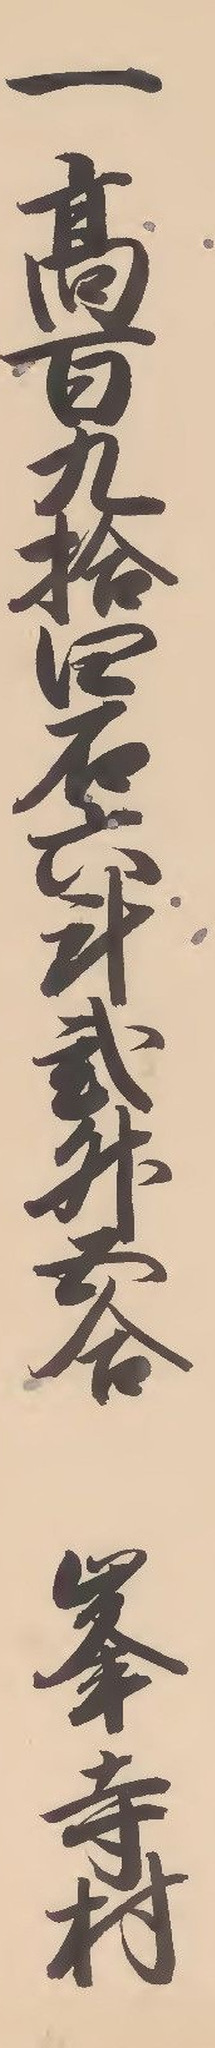一高百九拾四石六斗弐升五合峯寺村

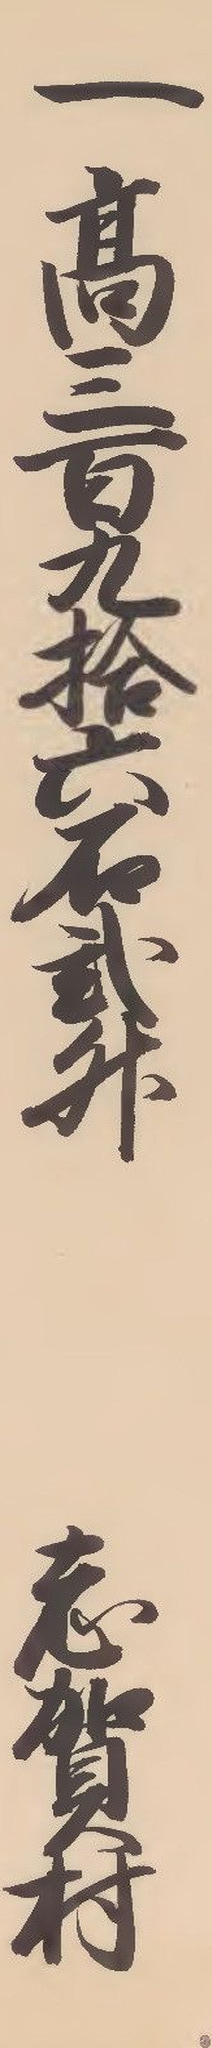一高三百九拾六石弐升志賀村
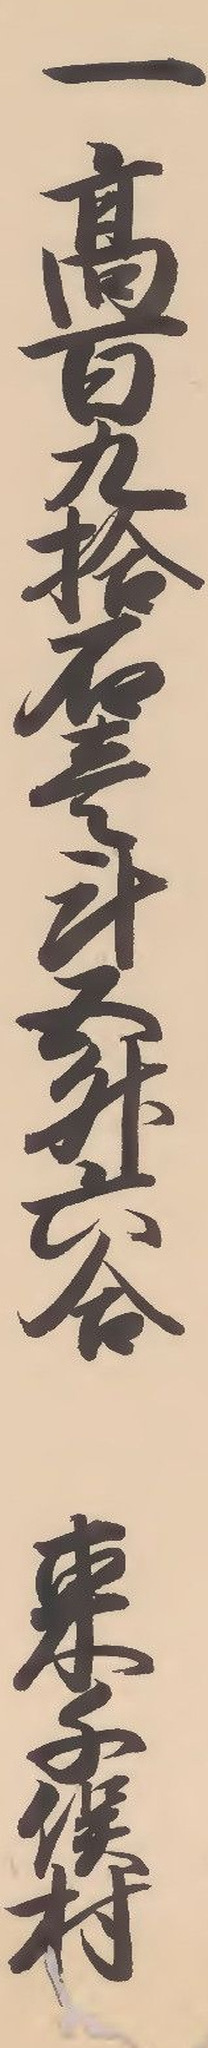一高百九拾石壱斗五升六合東千俣村
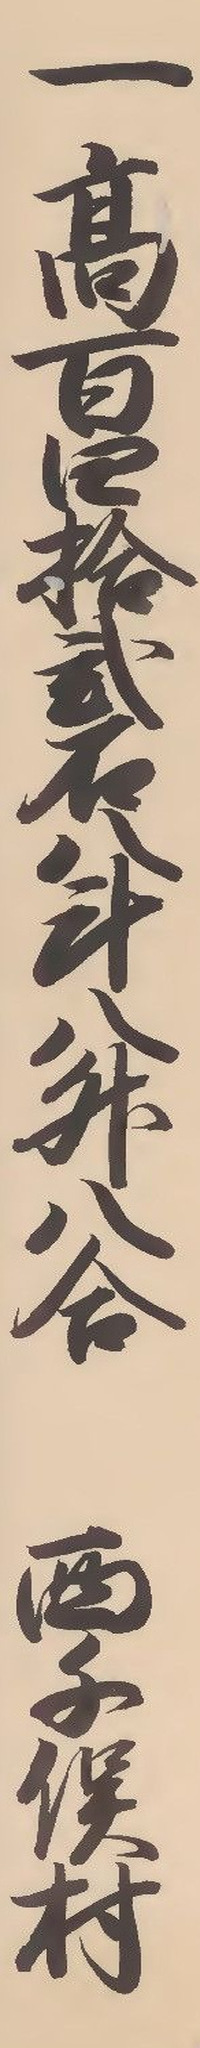一高百四拾弐石八斗八升八合西千俣村
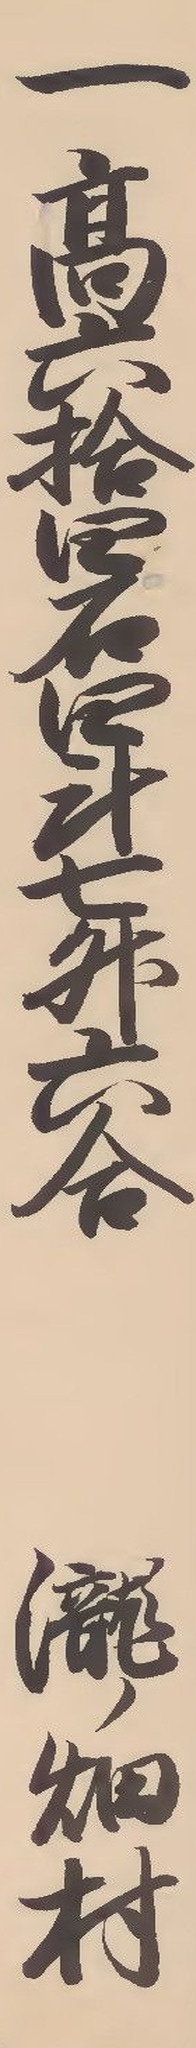一高六拾四石四斗七升六合滝ノ畑村
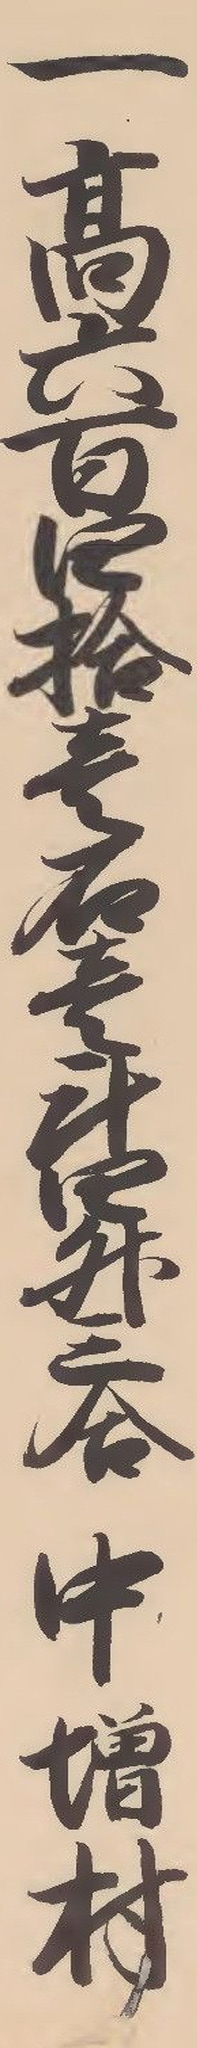一高六百四拾壱石壱斗四升三合中増村
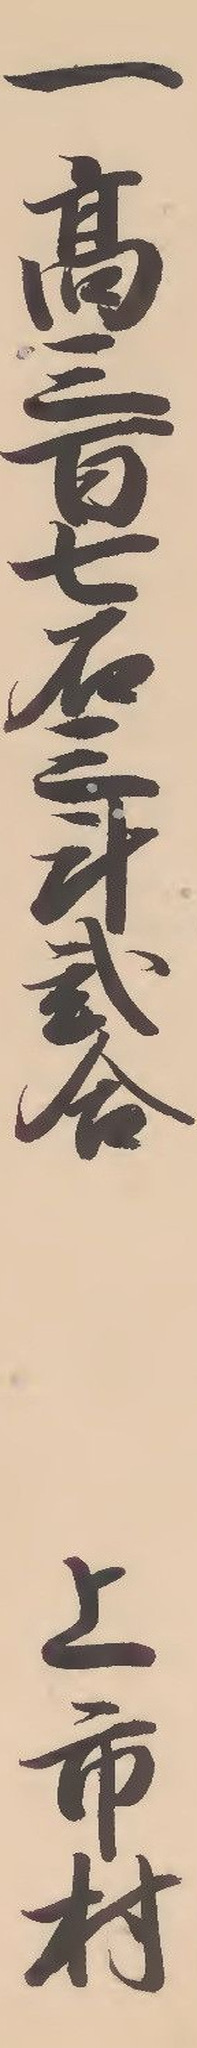一高三百七石三斗弐合上市村

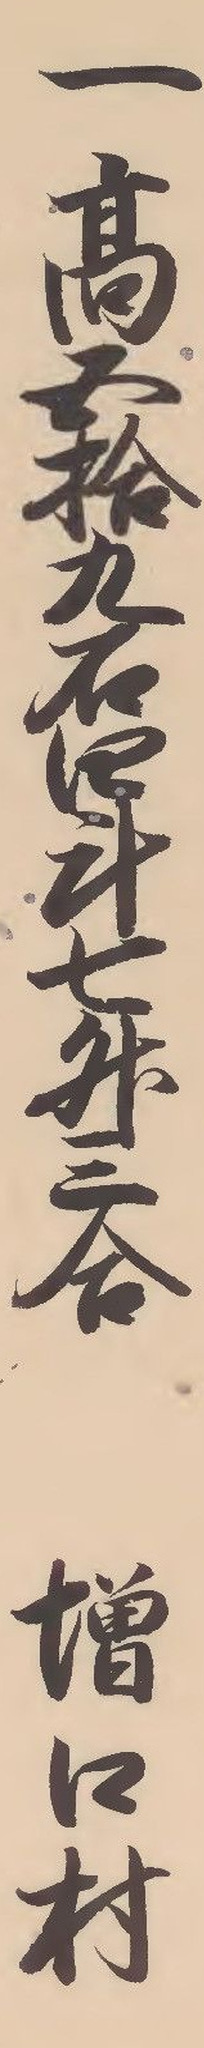一高五拾九石四斗七升三合増口村
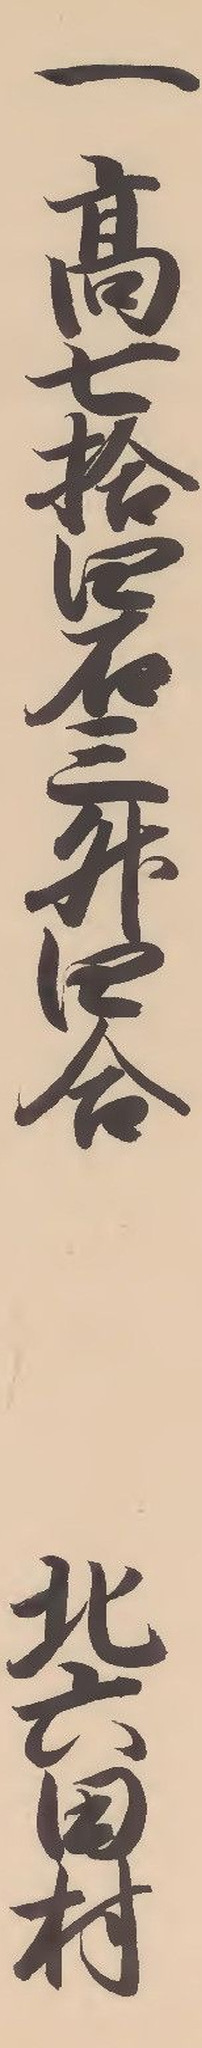一高七拾四石三升四合北六田村
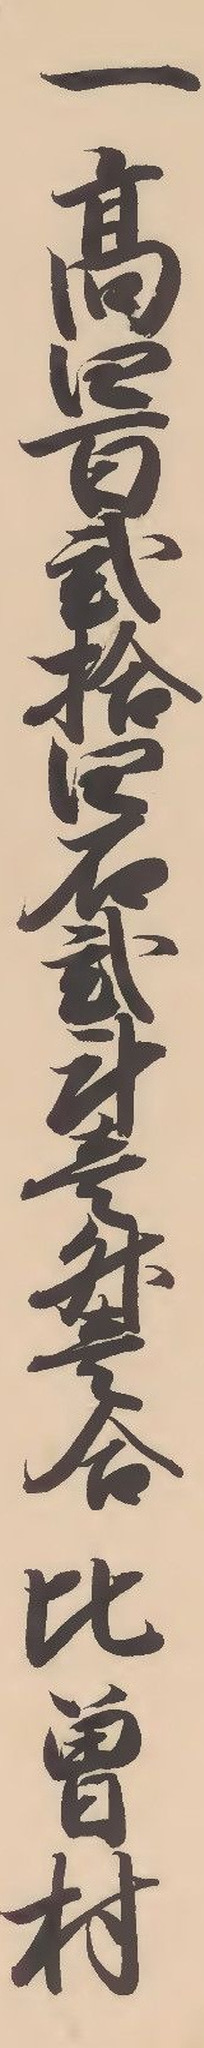一高四百弐拾四石弐斗壱升壱合比曽村
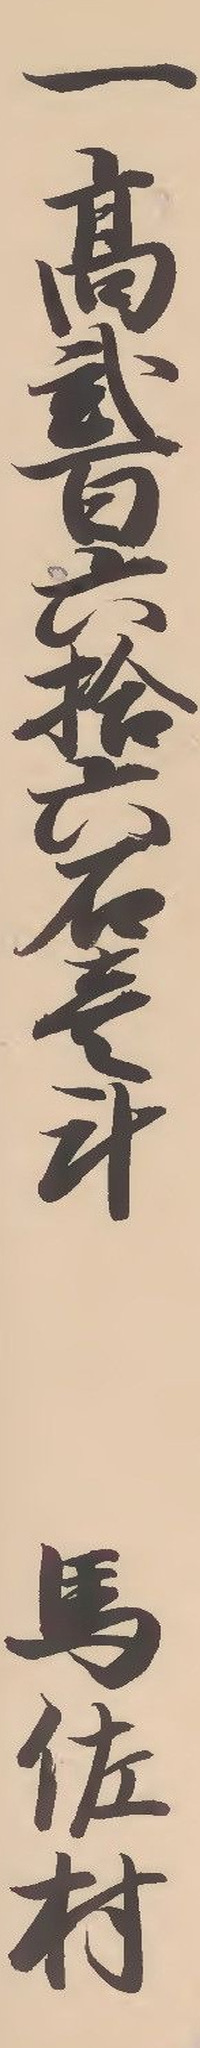一高弐百六拾六石壱斗馬佐村
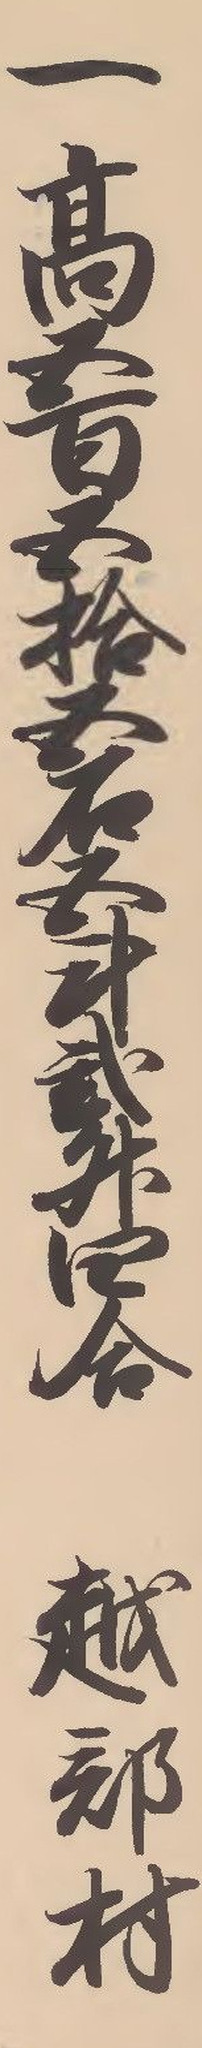一高五百五拾五石五斗弐升四合越部村
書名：大和国郷帳
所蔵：国立公文書館 National Archives of Japan
